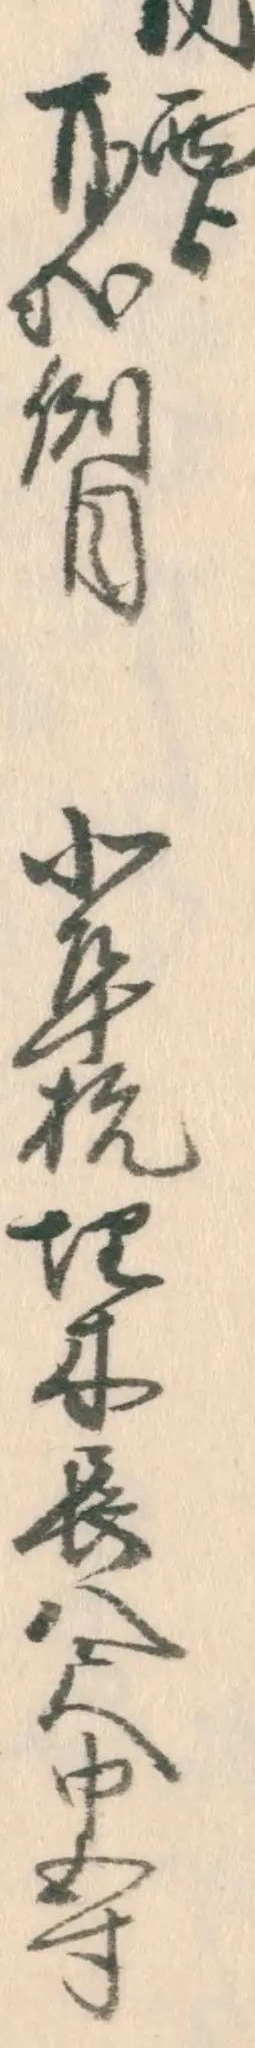廿弐側目北耳杭埋木長八尺巾五寸
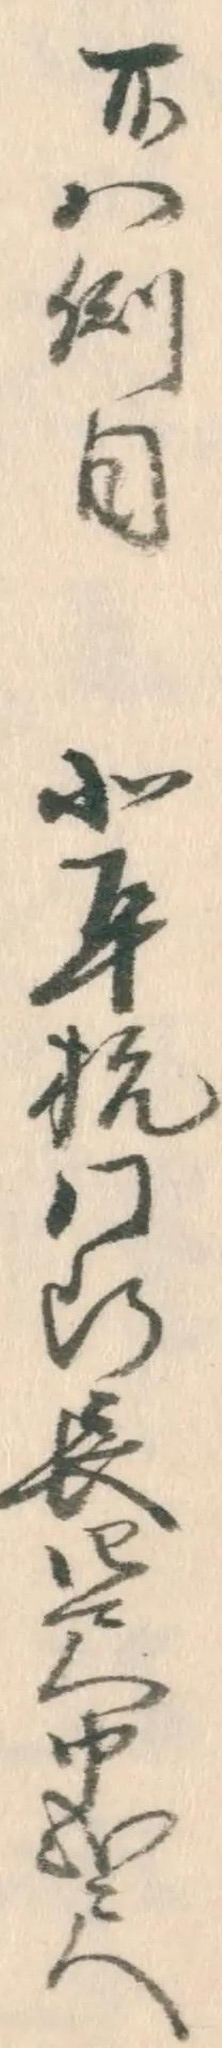廿八側目北耳杭同断長四尺巾弐尺
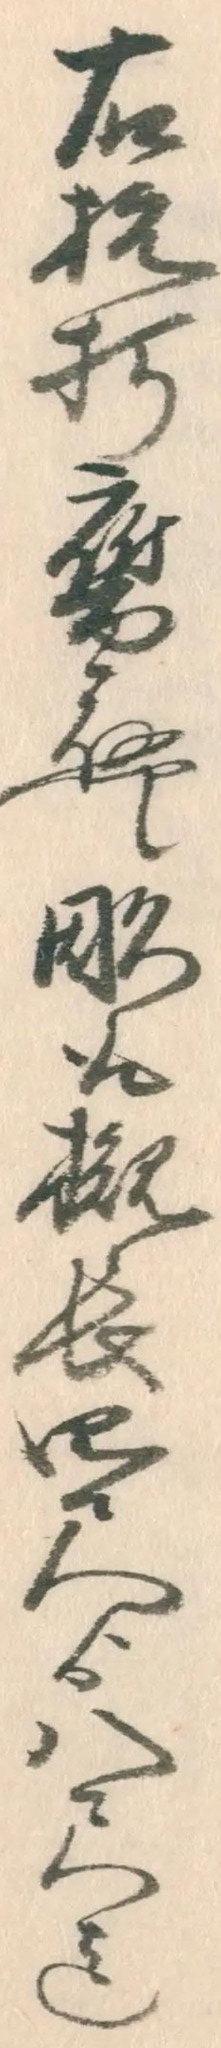右杭打朽腐応し彫取槻長四尺ゟ八尺迄
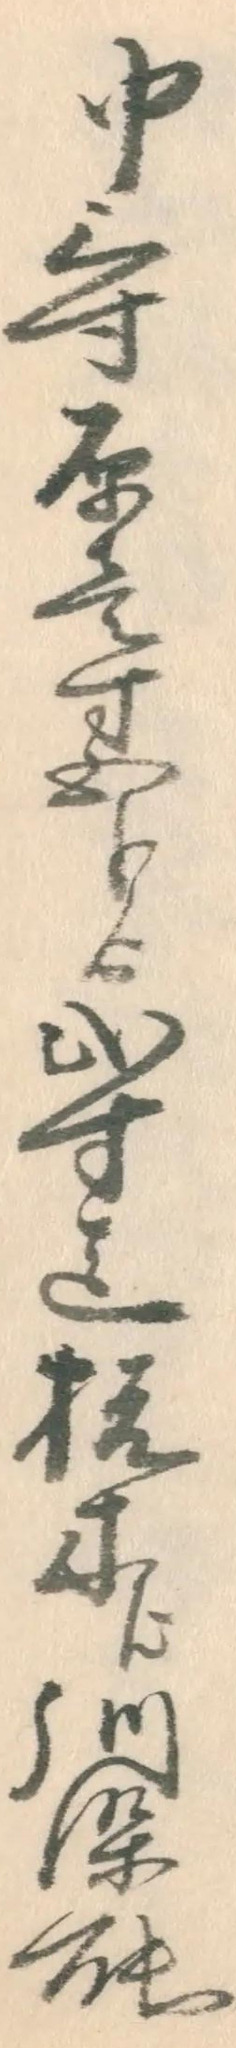巾三寸厚壱寸五分ゟ弐寸迄杭木え馴染能

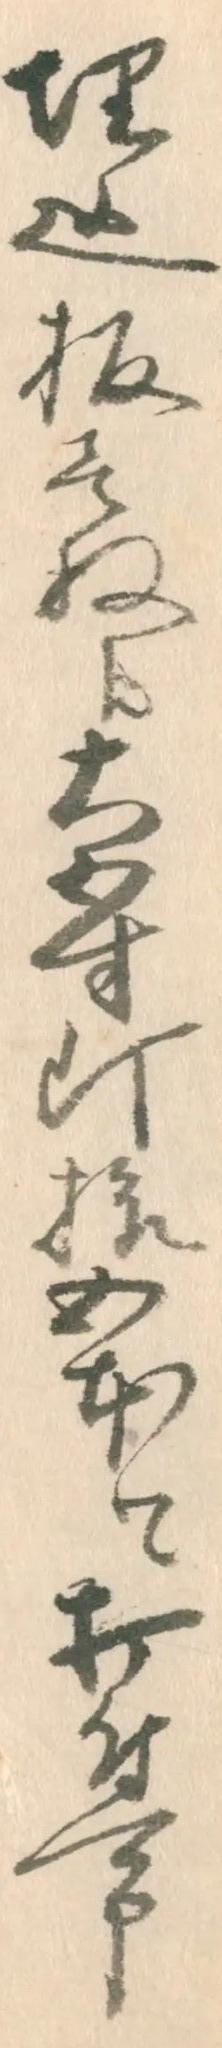埋込板壱枚え大五寸釘拾五本ツヽ打付可申
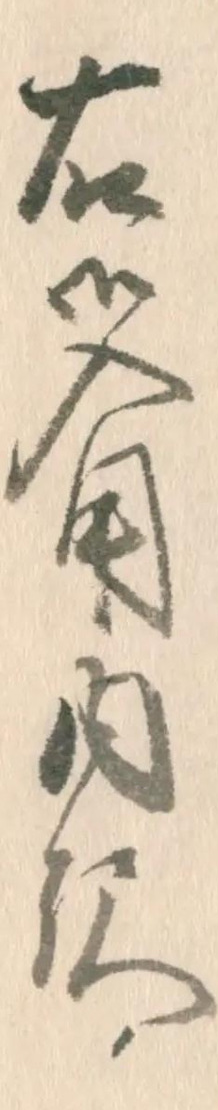右御入用内訳
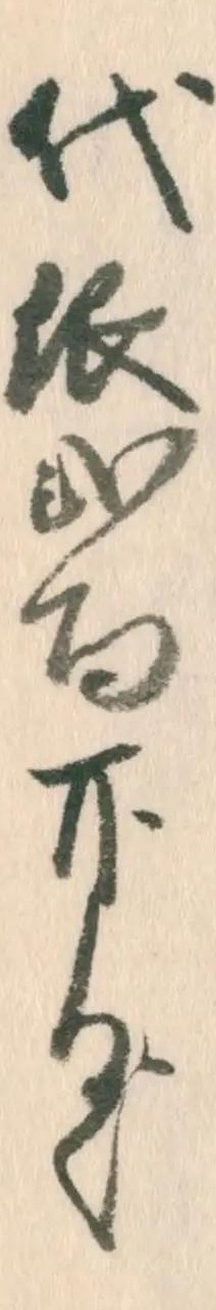代銀弐百廿匁但壱枚銀弐匁
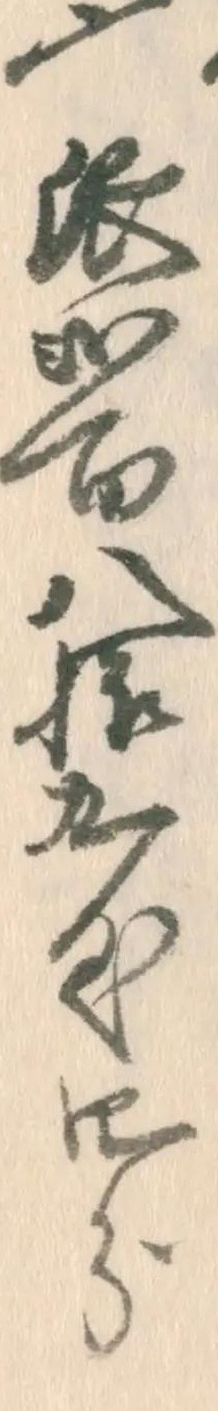〆銀弐百八拾九匁四分
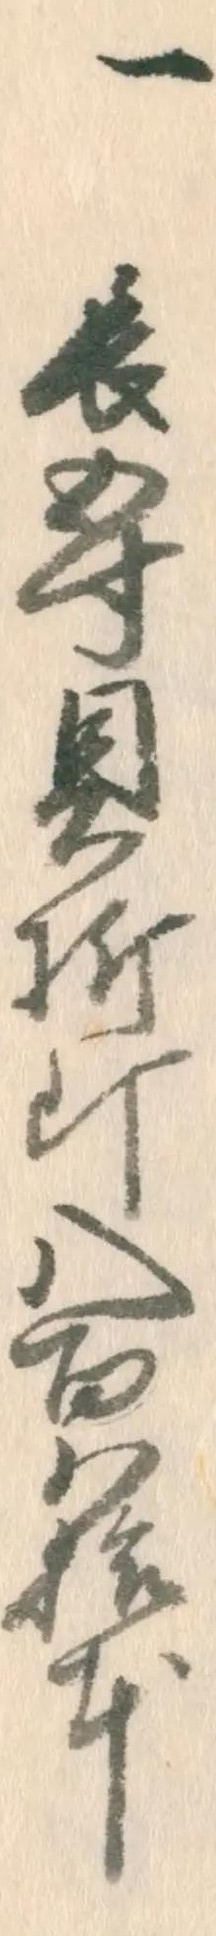一長五寸貝折釘八百八拾本
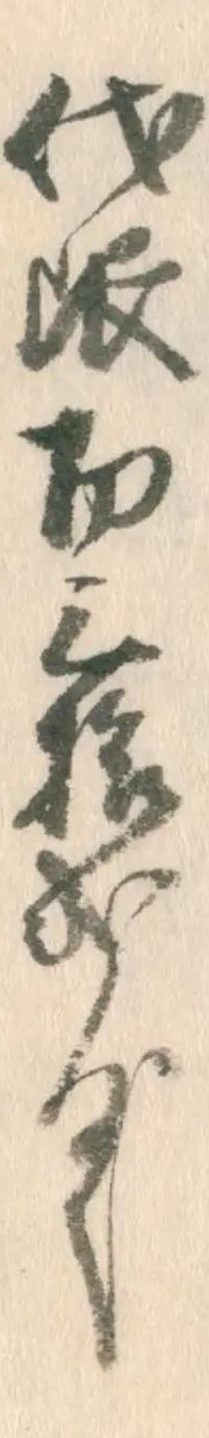代銀百三拾弐匁但百本銀拾五匁
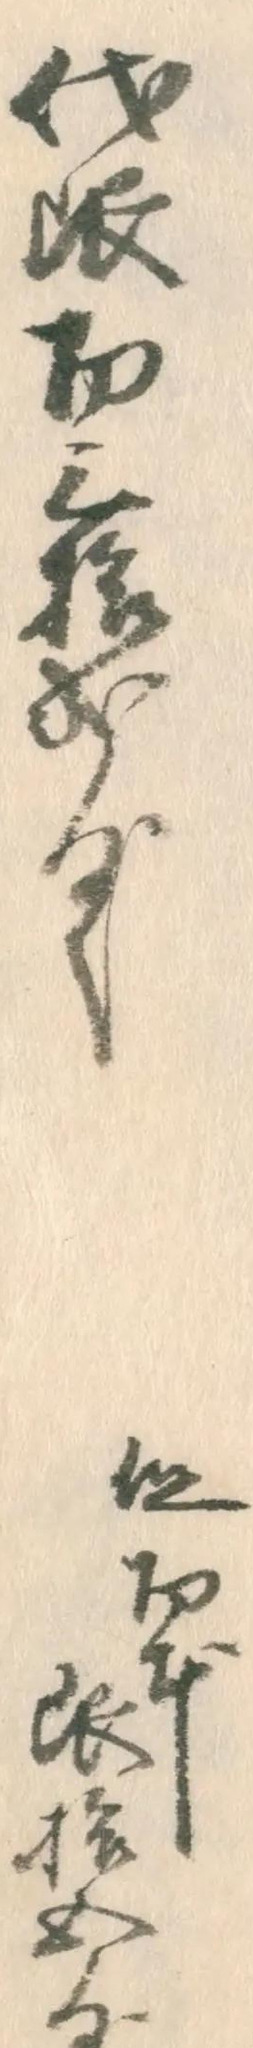代銀百三拾弐匁但百本銀拾五匁
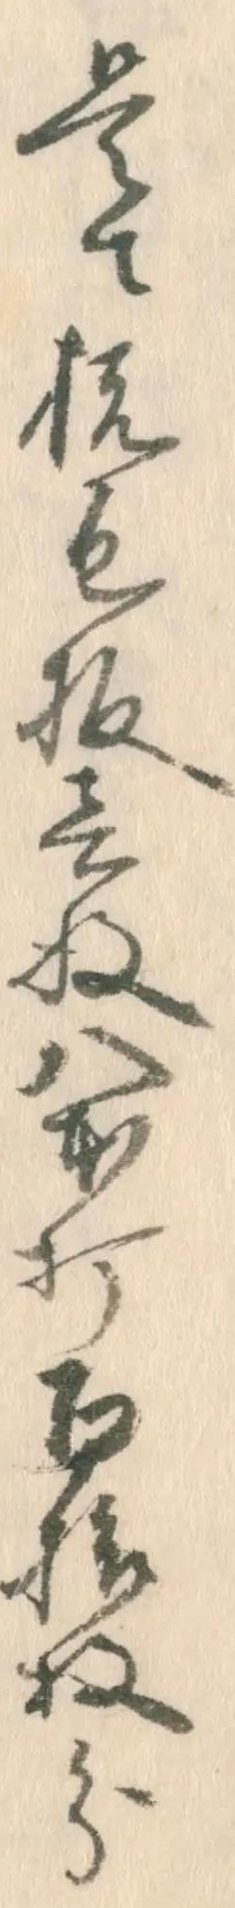是は杭包板壱枚八本打百拾枚分

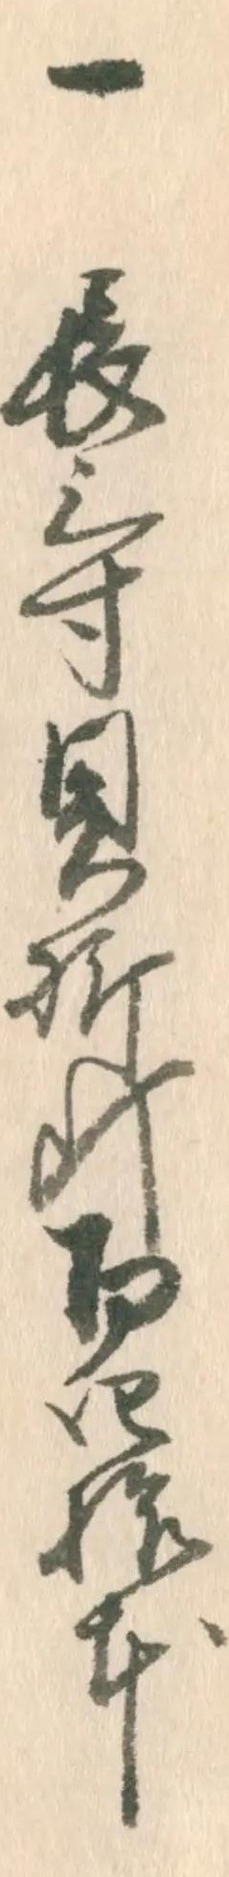一長三寸貝折釘百四拾本
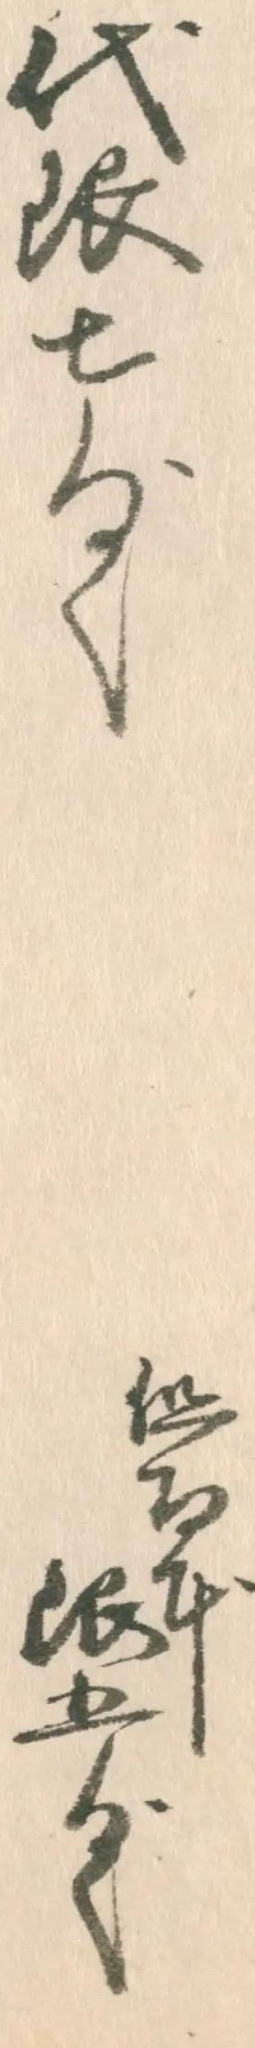代銀七匁但百本銀五匁
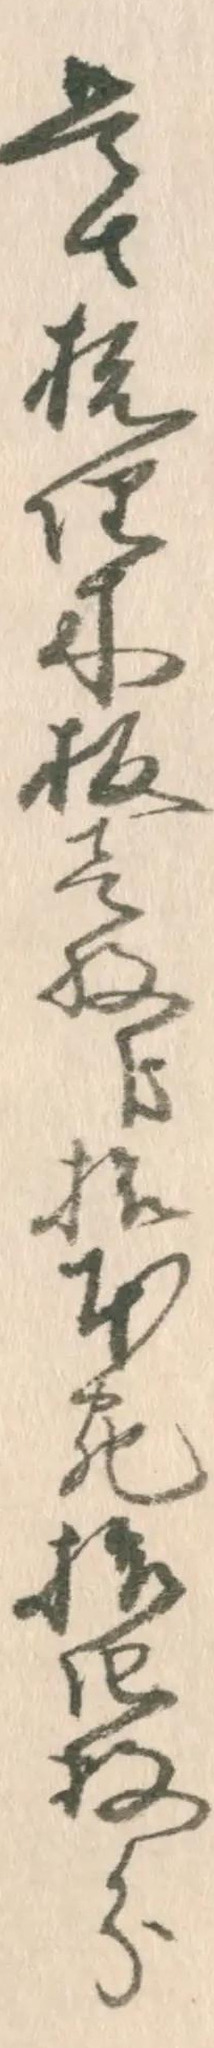是は杭埋木板壱枚え拾本宛拾四枚分
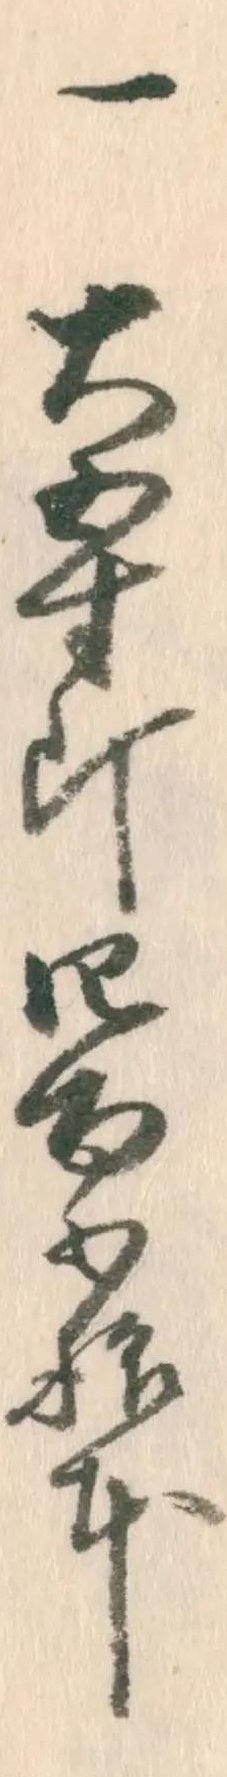一大五寸釘四百五拾本
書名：三橋 17巻. [7] 三橋小破御修復書留　但御奉行御掛リ替地震潰橋番屋　嘉永四亥年より安政二卯年迄　上
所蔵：国立国会図書館 National Diet Library, JAPAN
